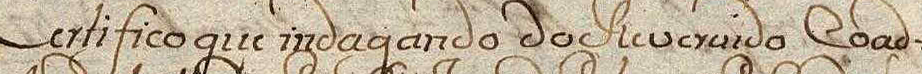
Certifico que indagando do Reverendo Coad
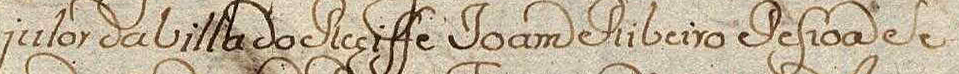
jutor da villa do Reciffe Ioam Ribeiro Pessoa se
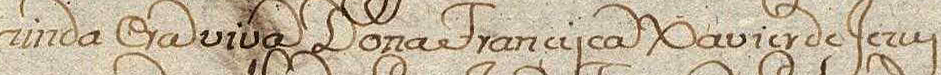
ainda era viva Dona Francisca Xavier de Jezus
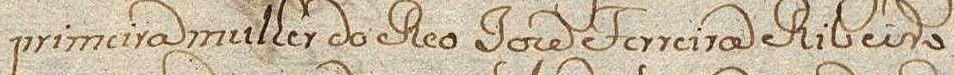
primeira mulher do Reo Ioze Ferreira Ribeiro
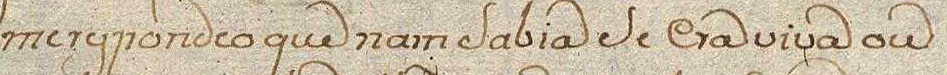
me respondeo que nam sabia se era viva ou
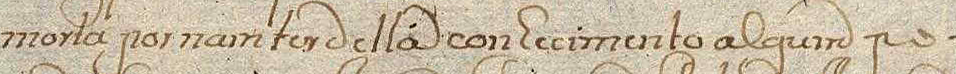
morta por nam ter della conhecimento algum po
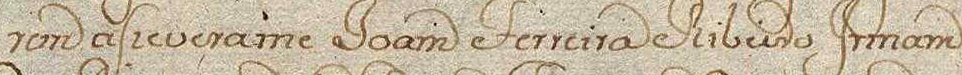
rem asseverame Ioam Ferreira Ribeiro Jrmam
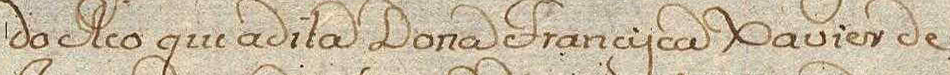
do Reo que a dita Dona Francisca Xavier de
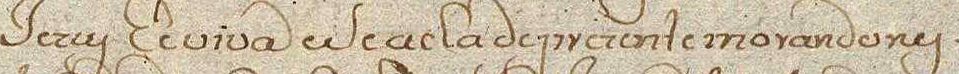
Iezus he viva e se acha de presente morando nes
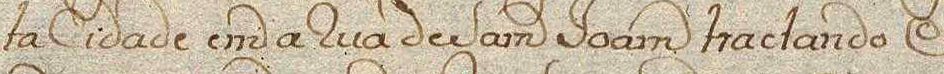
ta Cidade em a Rua de Sam Ioam tractando e
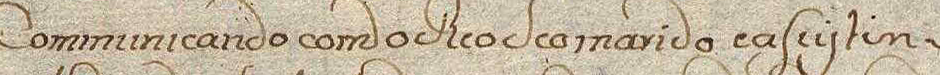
Communicando com o Reo seo marido e assistin
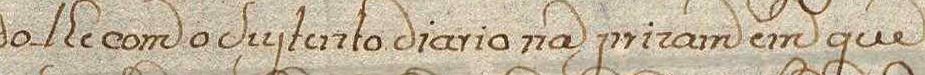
do-lhe com o sustento diario na prizam em que
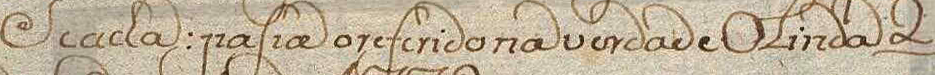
seacha: passa o referido na verdade OLinda 2
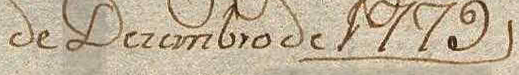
de Dezembro de 1772
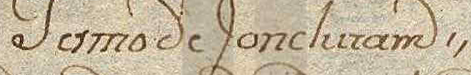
Termo de Concluzam//
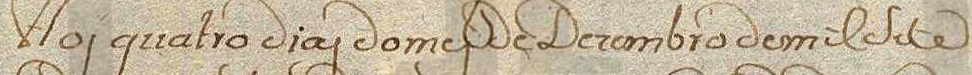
Aos quatro dias do mes de Dezembro de mil sete
